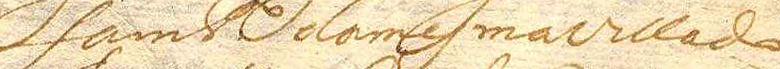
sam P.o da mesma villa do
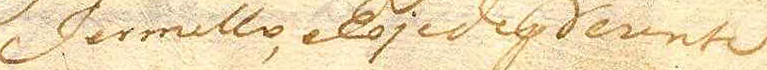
Jermello, e hoje de prezente
